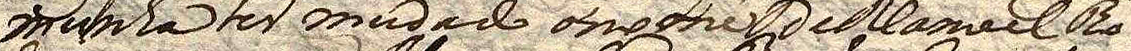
munha ter mudado o nome de Manoel Ro
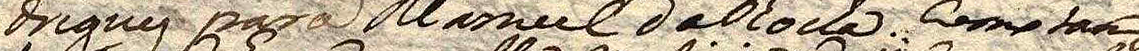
drigues para Manuel da Rocha. Como tam
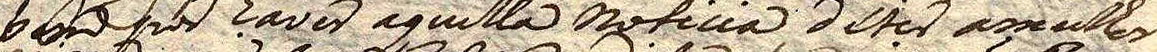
bem por haver aquella noticia de ter a mulher
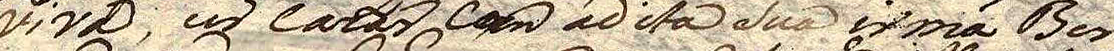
viva, vir cazar com a dita sua irmã Ber
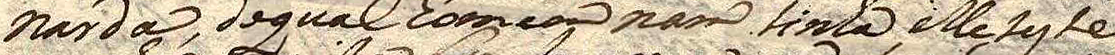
narda, do qual homem nam tinha elle teste
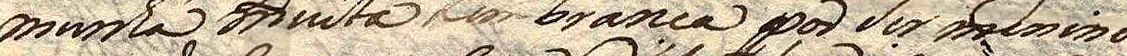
munha muita Lembrança por ser menino
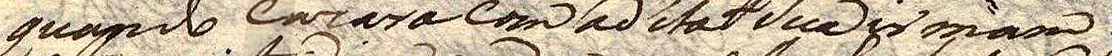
quando cazara com a dita sua irmam.
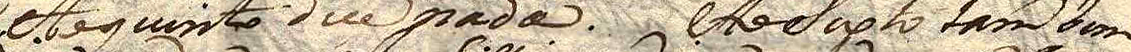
Ao quinto dice nada. Ao Sexto tambem
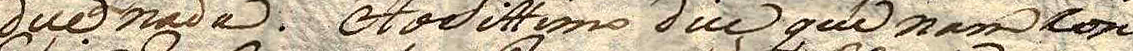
diçe nada. Ao Sittimo diçe que nam con
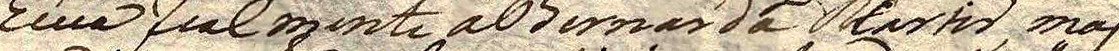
hecia Realmente a Bernarda Martir, mas
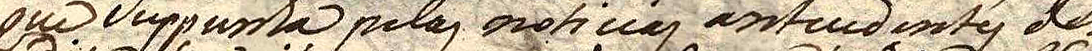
que supunha pelas noticias antecedentes ser
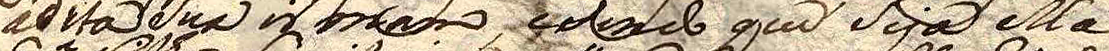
a dita sua irmam, e Sendo que seja ella
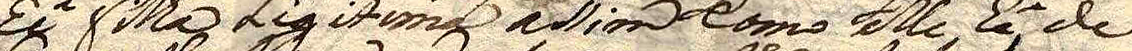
hé filha Legitima assim como elle, hé de
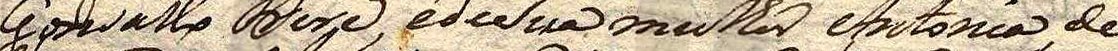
Gonsallo Frere, e de sua mulher Antonia de
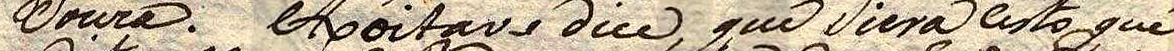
Souza. Ao oitavo dice, que vivera certo que
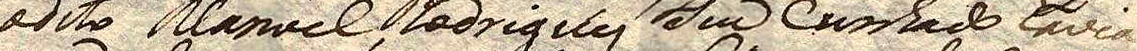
o dito Manoel, Rodrigues seu cunhado havia
